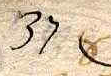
37
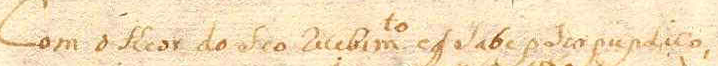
Com o Theor do seo Recebim.to e q̄ Sabe p ser puplico,
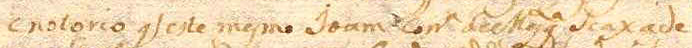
e notorio q̄ este mesmo Ioam Corra de Mesqta se axa de
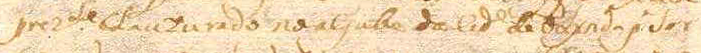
prez.te cLauzurado no aljuble da Cid.e de baxada p̄ ser
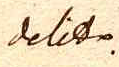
delito.
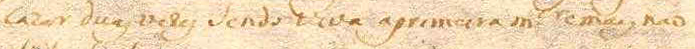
cazar duas vezes sendo viva a primeira m.er se mais naõ
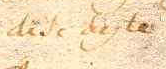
dise deste
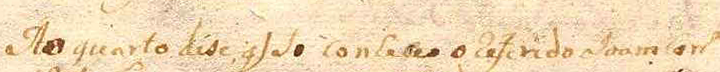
Ao quarto dise, q̄ só conheceo o Referido Ioam Corra
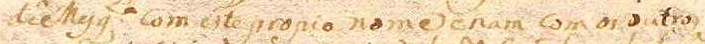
de Mesq.ta com este propio nome, e nam com os outros
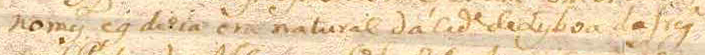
nomes e q̄ dezia era natural da Cid.e de Lisboa da frega
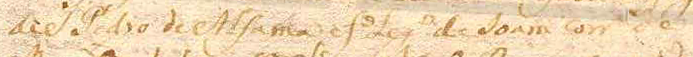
de s Pedro de Alfama; e fo Leg.o de Ioam Corra de
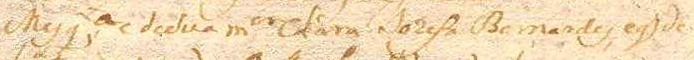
Mesq.ta e de sua mer CLara Iozefa Bernardes, e q̄ de
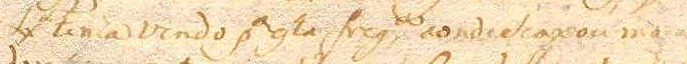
Lxa tenha vindo p.a esta freg.a aonde se axou mora
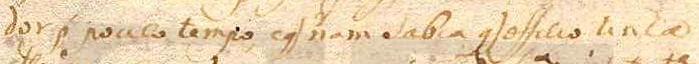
dor p̄ pouco tempo, e q̄ nam Sabia q̄ officio tinha
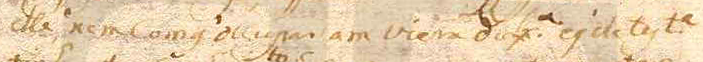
ella, nem com q̄ occupasam viera de Lx.a e que test.a
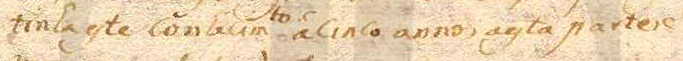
tinha este conhecimto a cinco annos a esta partes e
